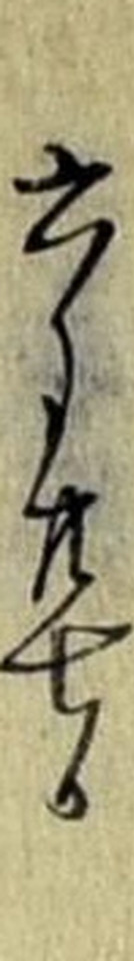六月廿七日
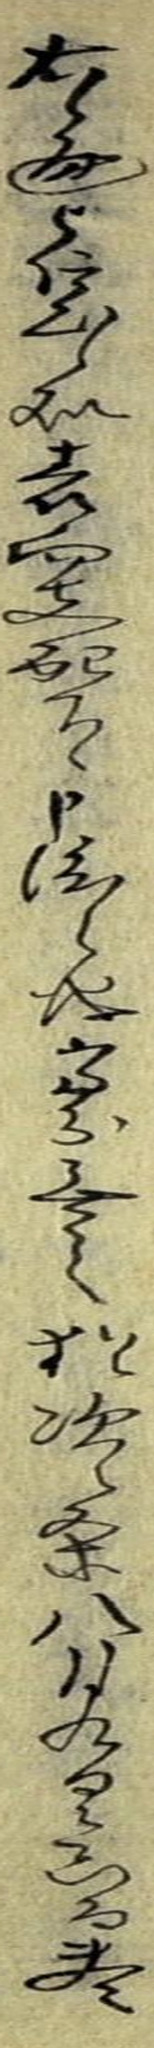右之通被仰出候処表向支配下へ申渡候儀当分無之猶次之条八月九日に至而夫々

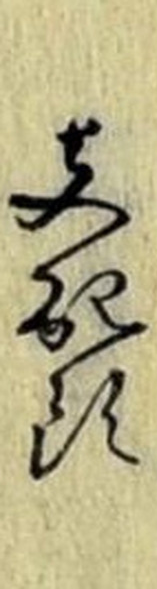支配頭
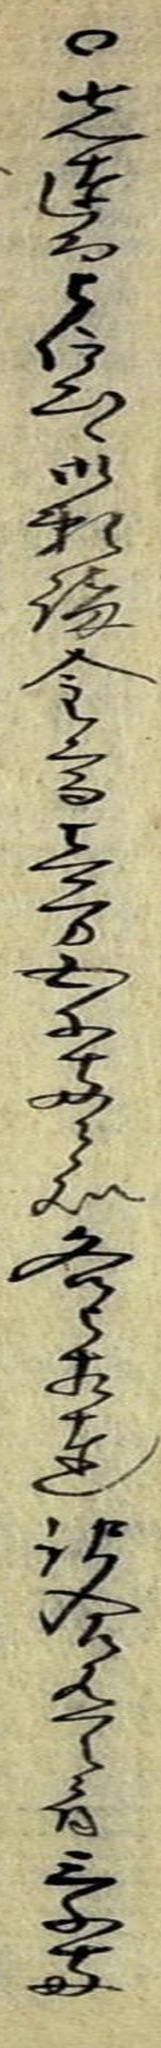○先達而被仰出候御頼講金高壱万五千両之処各被相達訳合有之に付三千両
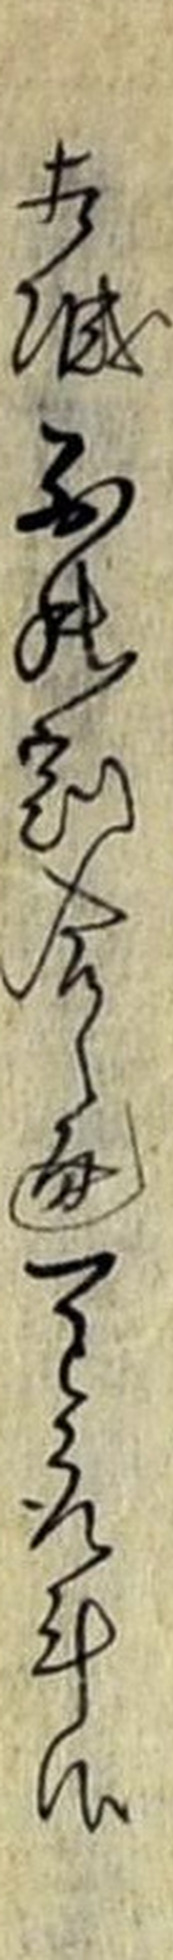相減別紙割合之通可被取斗候
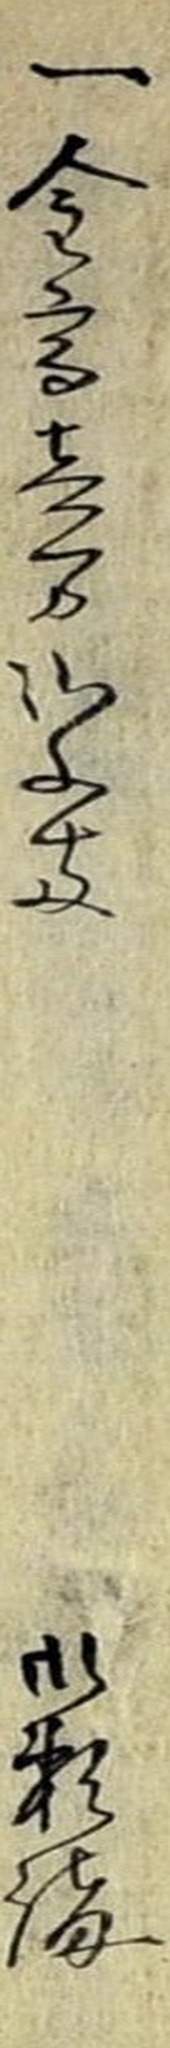一金高壱万弐千両御頼講
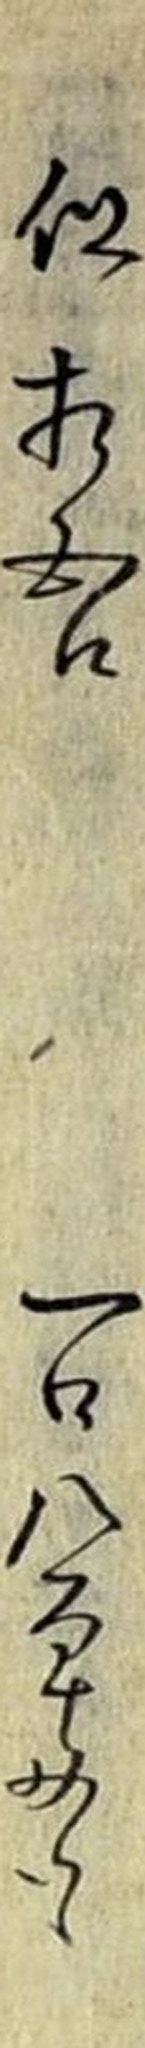但拾五口一口八百両つヽ
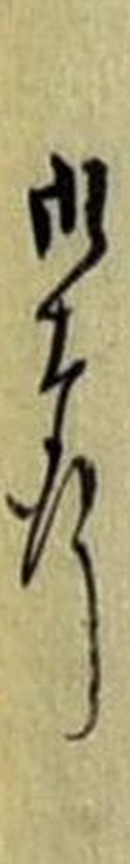御奉行
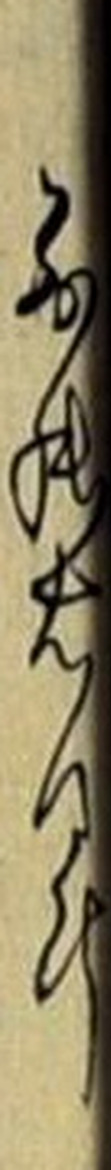別紙右同断
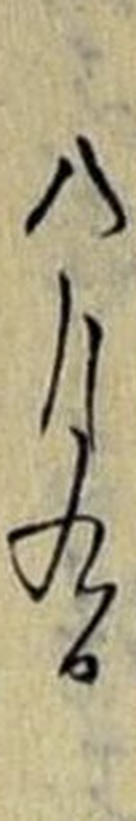八月九日
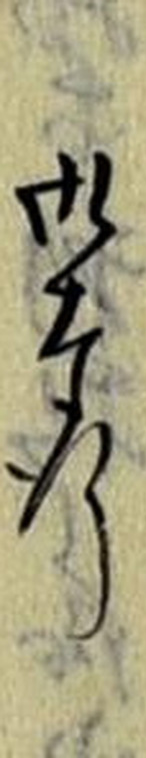御奉行
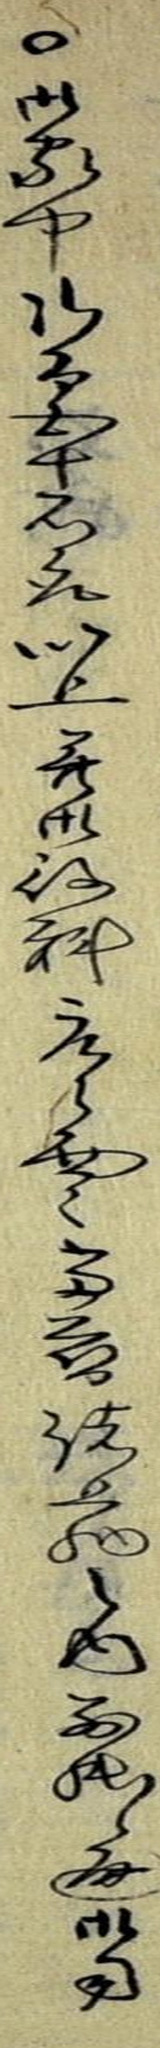○御家中弐百五十石以上并御役料取之面当暮諸上物之内別紙之通御用
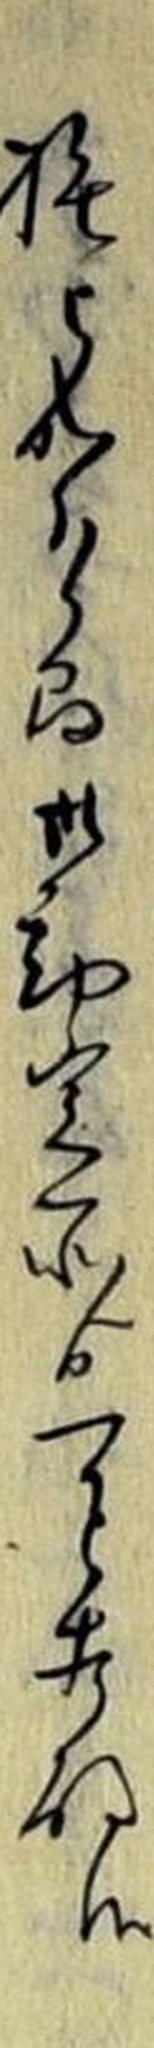捨被成下候間御勘定所ゟ可被相触候
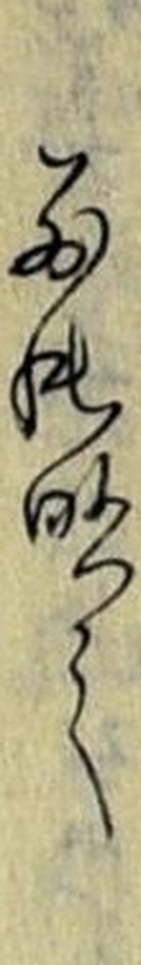別紙略之
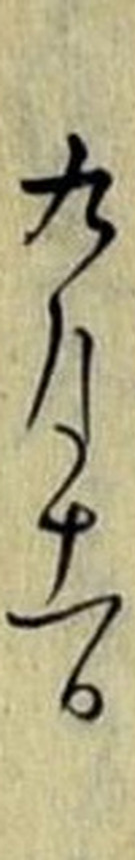九月十一日
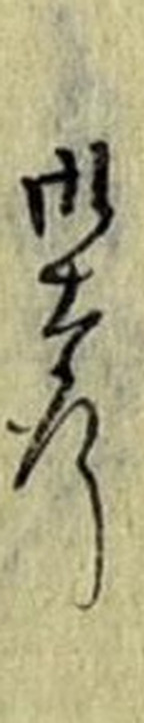御奉行
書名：命令之部 四
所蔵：福井県文書館 Fukui Prefectural Archives
